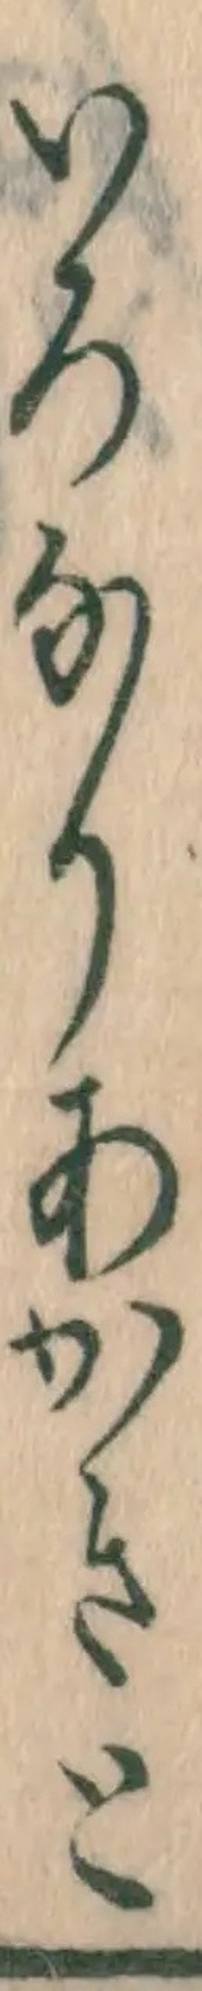いろなりあかきと
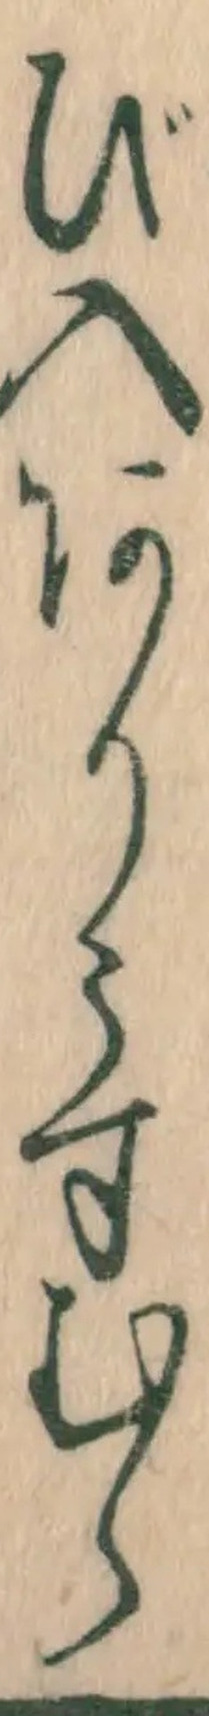び入ありうすむら
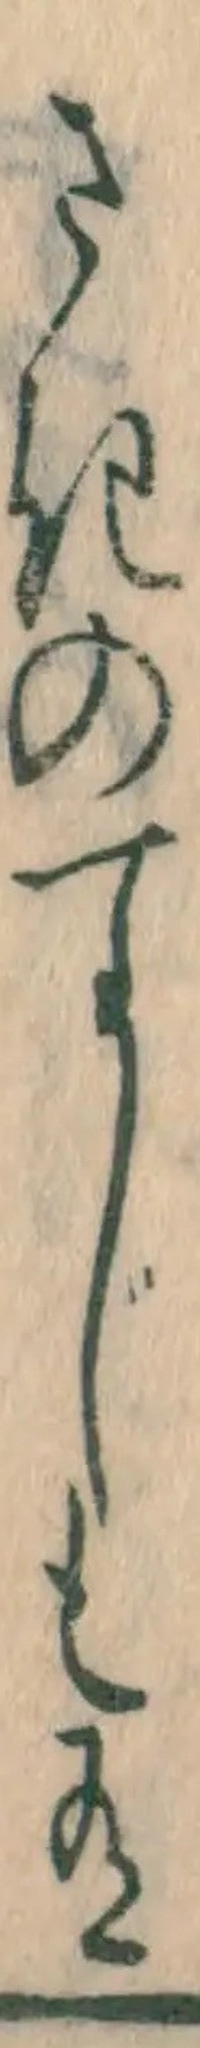さきのすじも有

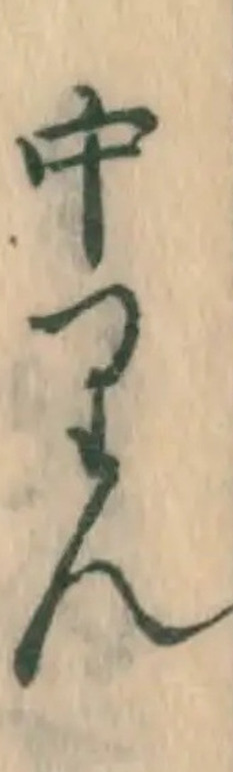中りん
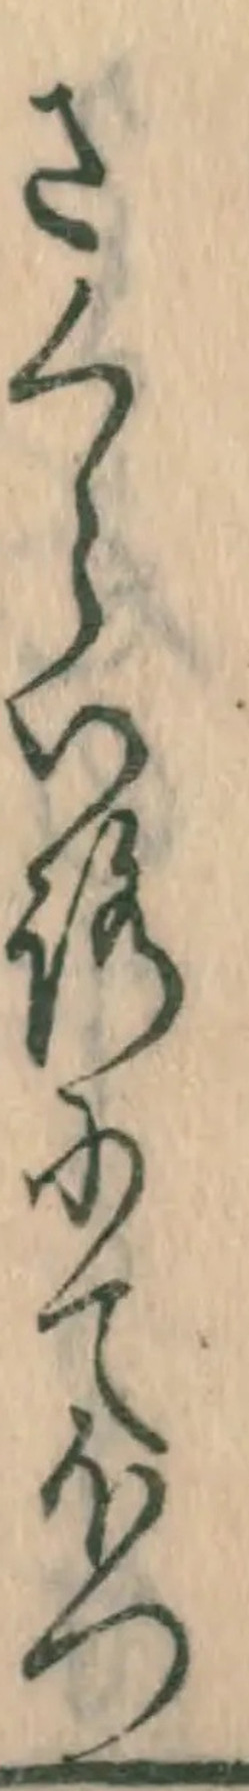さくらいろにてほつ
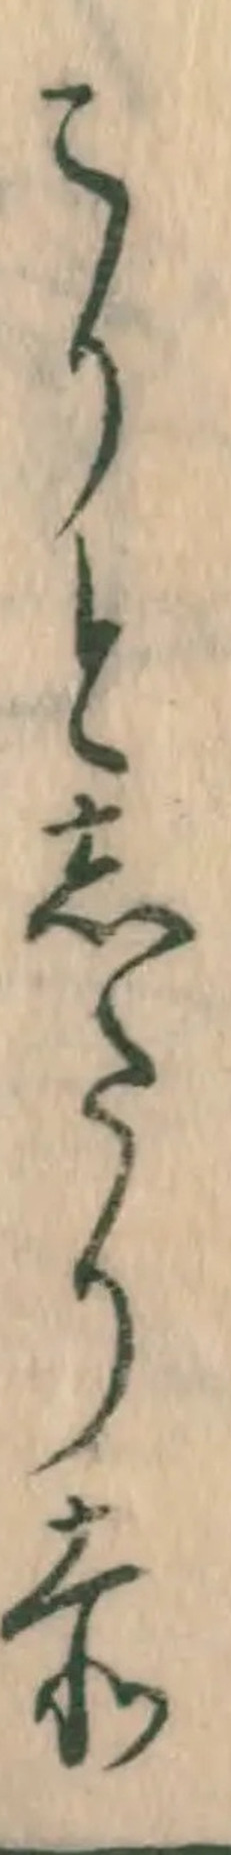こりとしたり赤
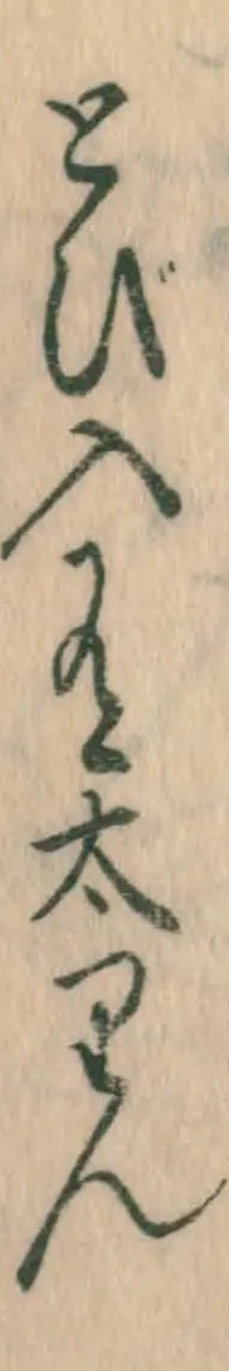とび入有太りん
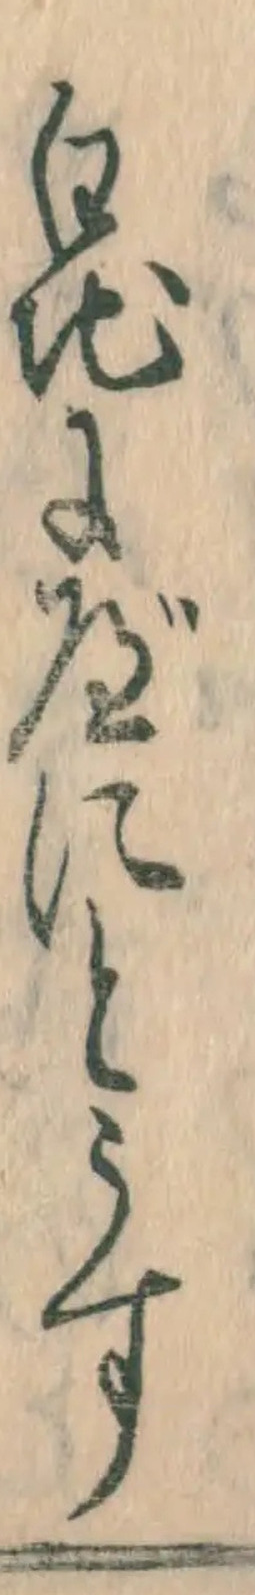白地にべにとうす

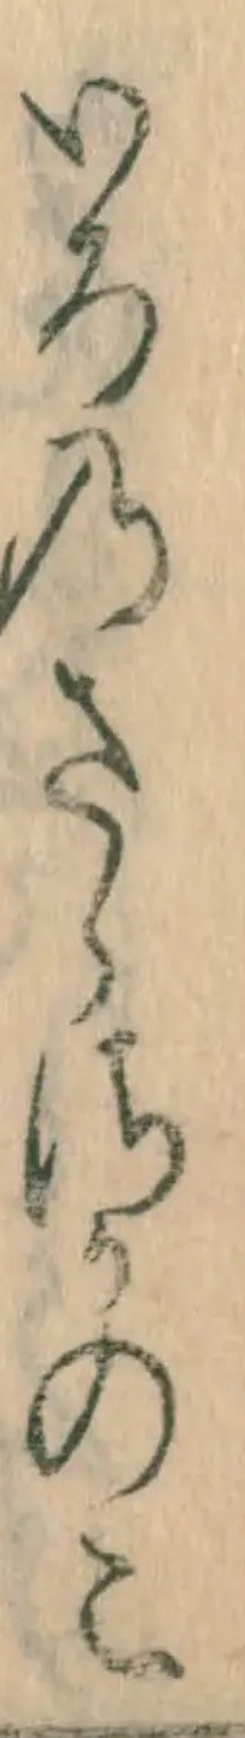いろのさらさかのこ
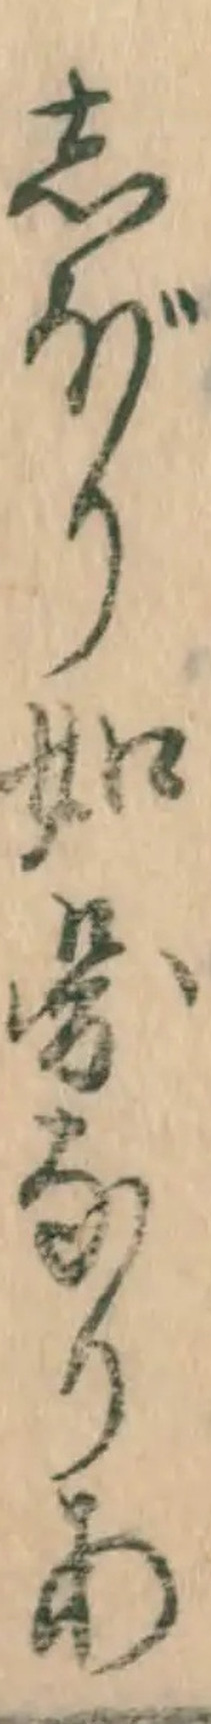しぼり如図なりあ
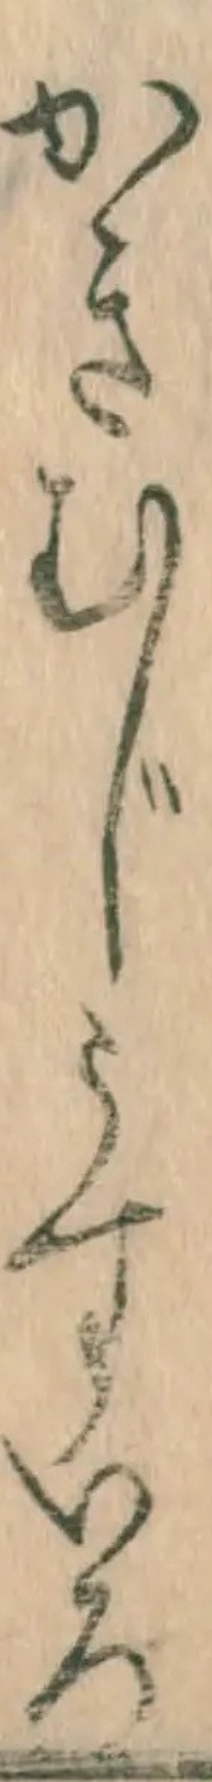かきむじうすいろ
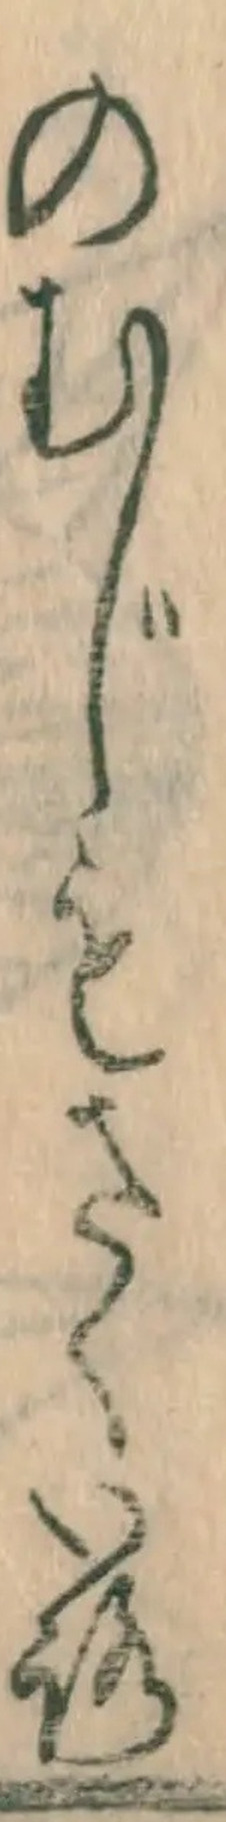のむじもさくいろ
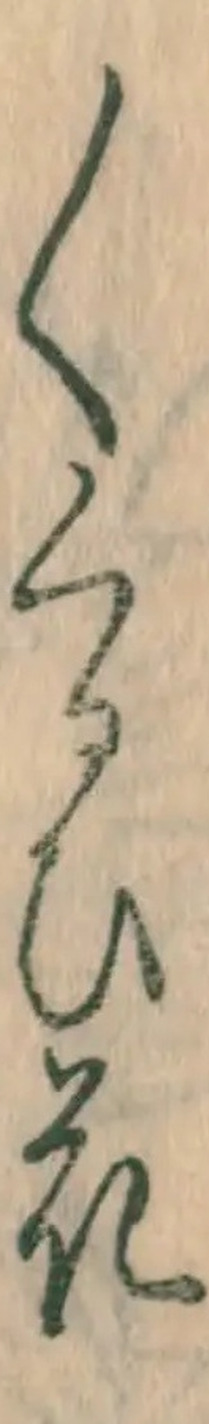〳〵くるひ花
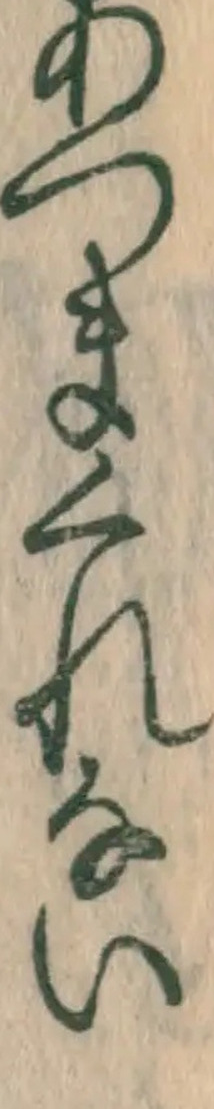●あつまくれない
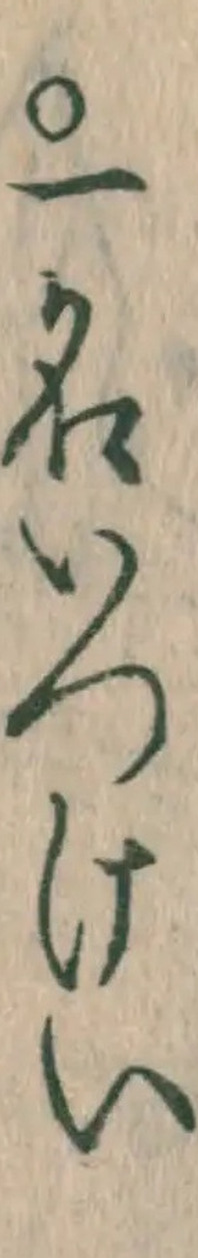○一名いつけい
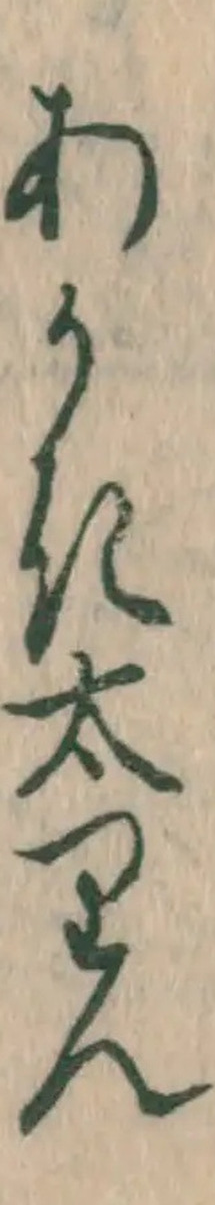あかき太りん
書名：錦繍枕 5巻. [5]
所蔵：国立国会図書館 National Diet Library, JAPAN
